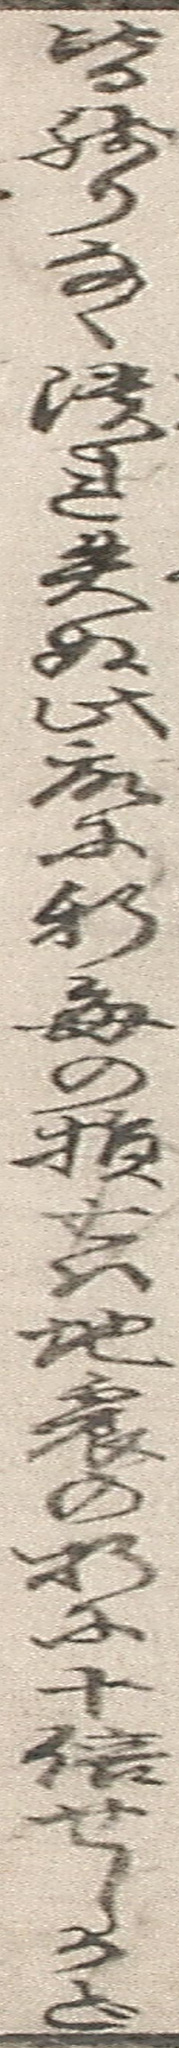皆残りなく潰れ失ぬ此度に軒毎の損亡ハ地震の折に十倍せしかど
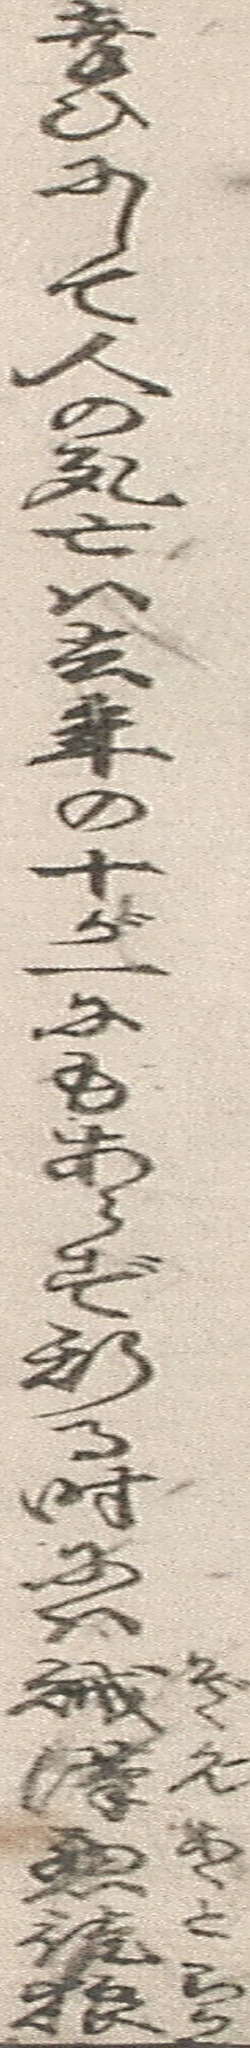幸ひにして人の死亡ハ去年の十が一にもあらず斯る時ハ賊漢悪徒狼
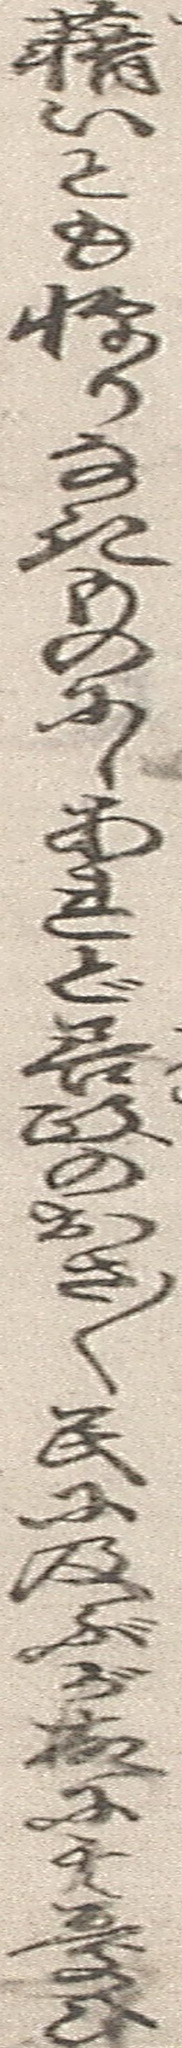藉いとも憚りなきものにしあれど善政のおさ〳〵民に及ぶが故に其憂ひ
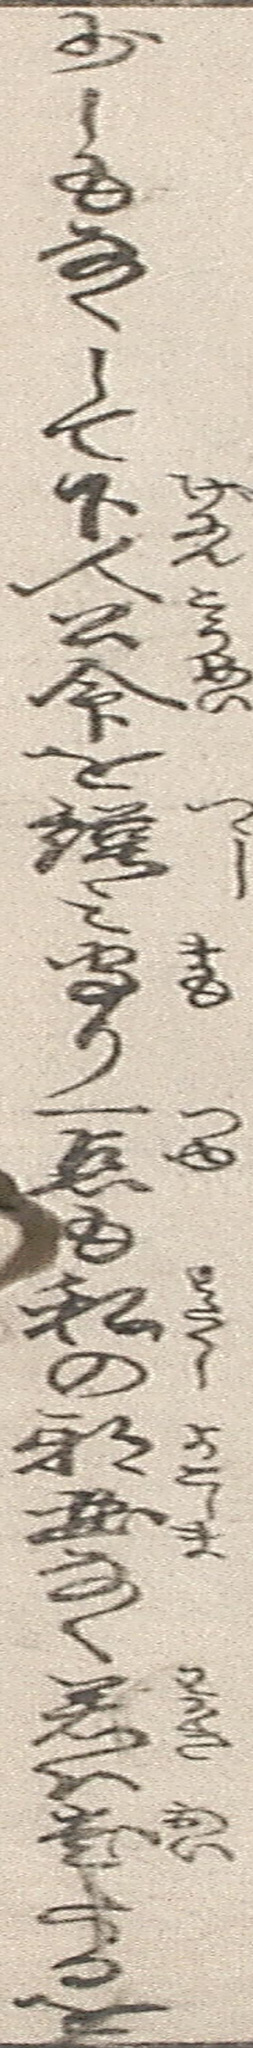少しもなくして下人公命を謹ミ守り一点も私の邪曲なく若ハ老たるを
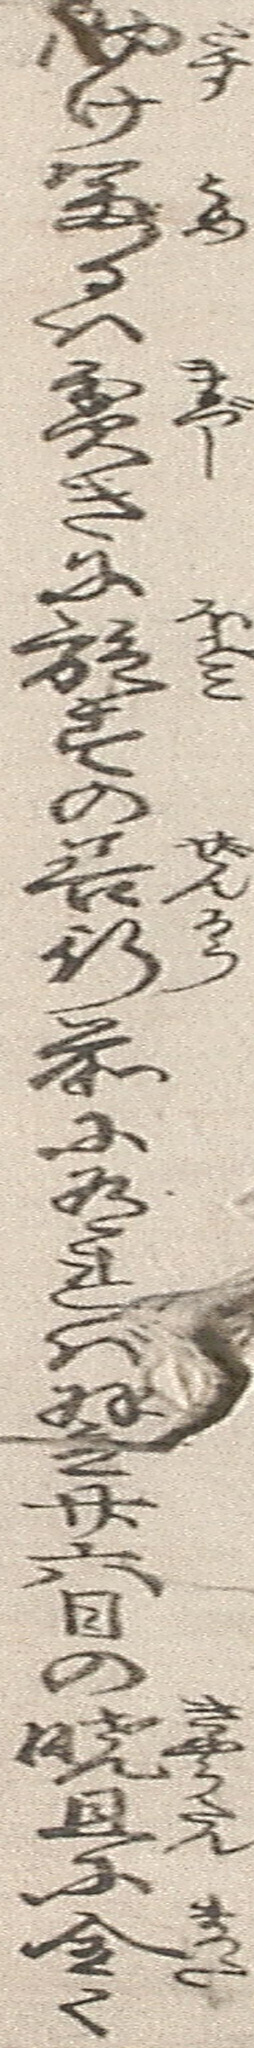助け富るハ貧きに施すの善行前に有れハ翌廿六日の暁旦に全く
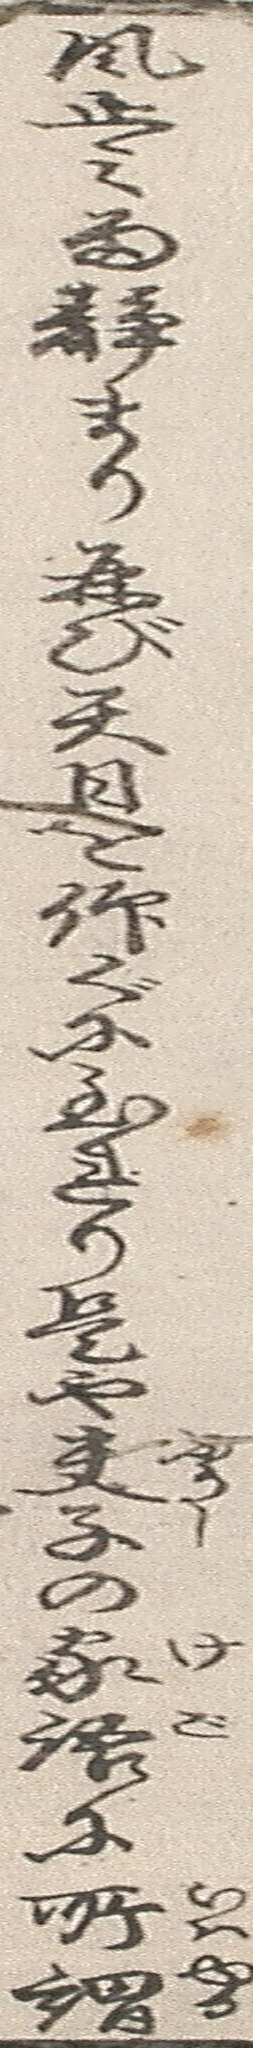風止ミ雨静まり再び天日を仰ぐに至れり是や夫子の家語に所謂
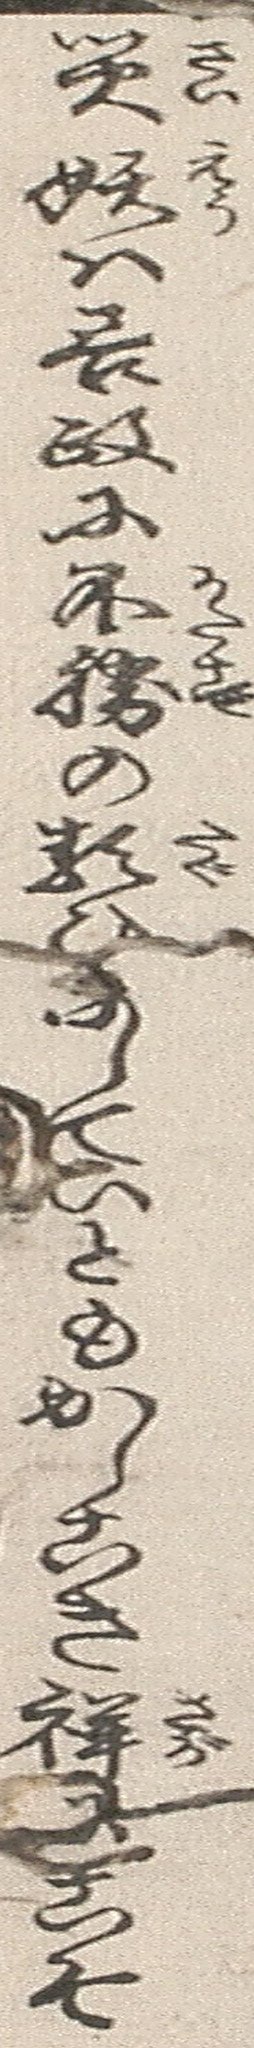災妖ハ善政に不勝の類ひにしていともかしこき祥にこそ
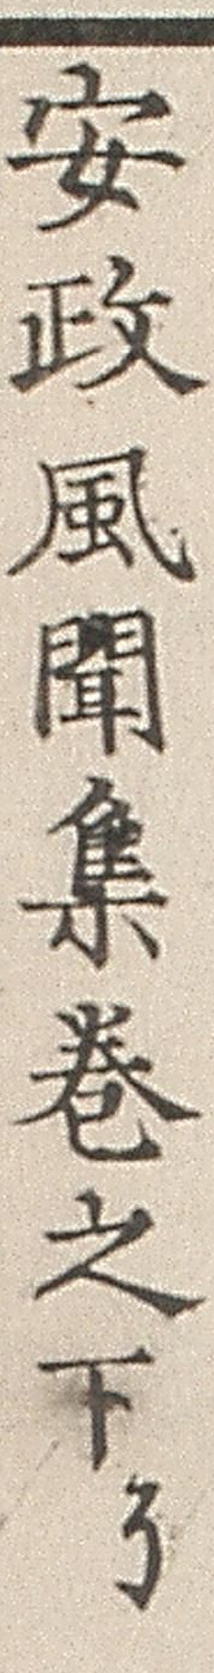安政風聞集巻之下了
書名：安政風聞集　上中下　全
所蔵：東京大学地震研究所図書室 Earthquake Research Institute Library, The University of Tokyo, JAPAN
